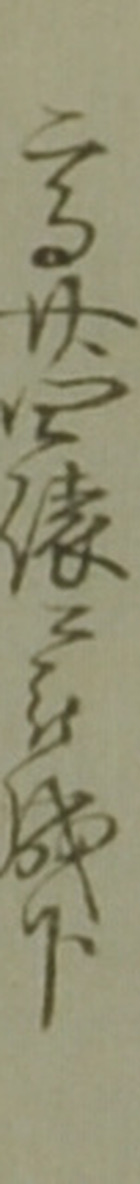高廿四俵ニ被成下

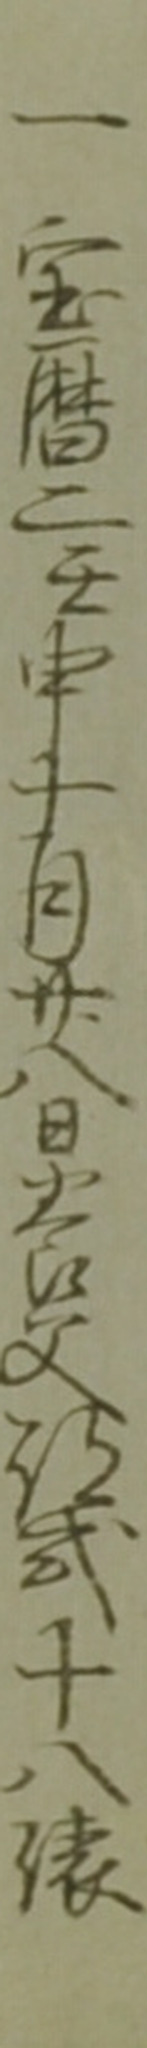一宝暦二壬申十月廿八日養父跡式十八俵
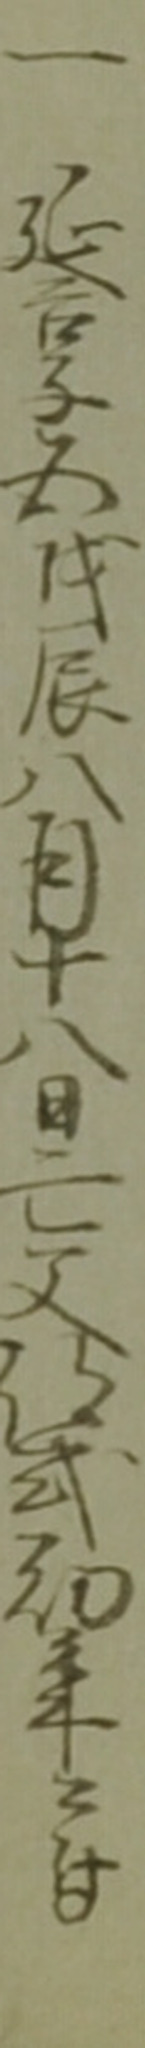一延享五戊辰八月十八日亡父跡式幼年ニ付
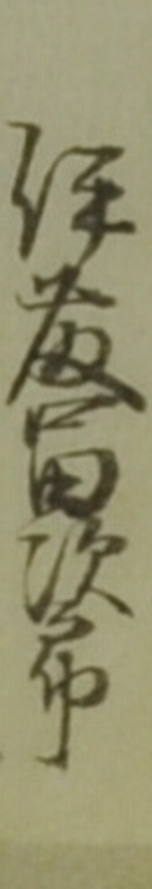伊藤庄次郎
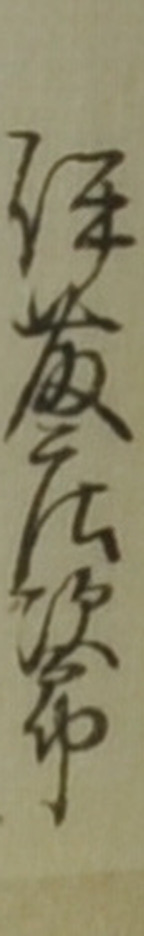伊藤庄次郎

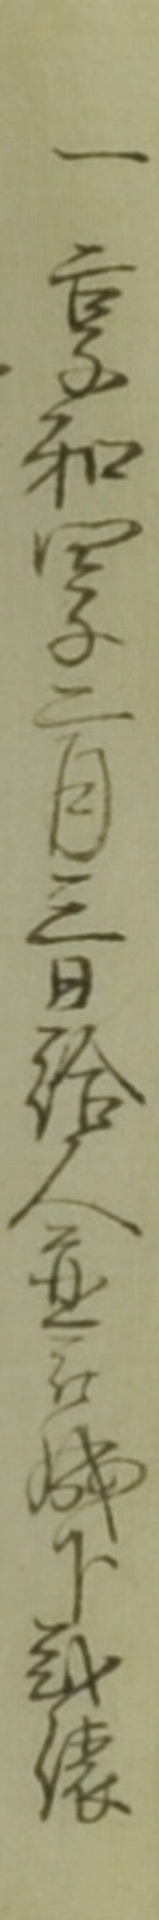一享和四子二月三日給人並被成下弐俵
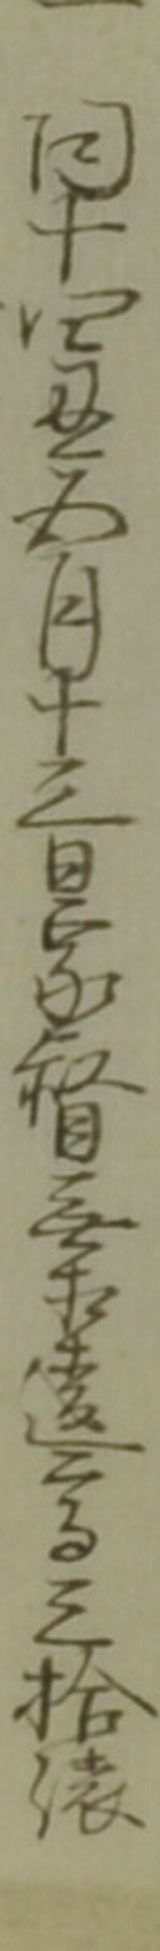一同十四丑五月十三日家督無相違高三拾俵
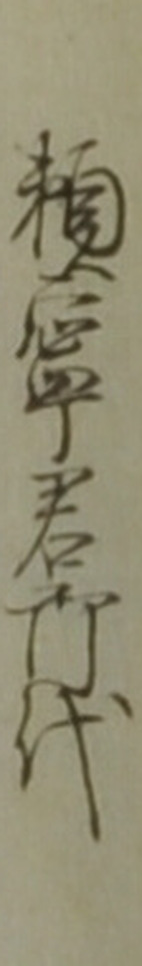頼寧君御代
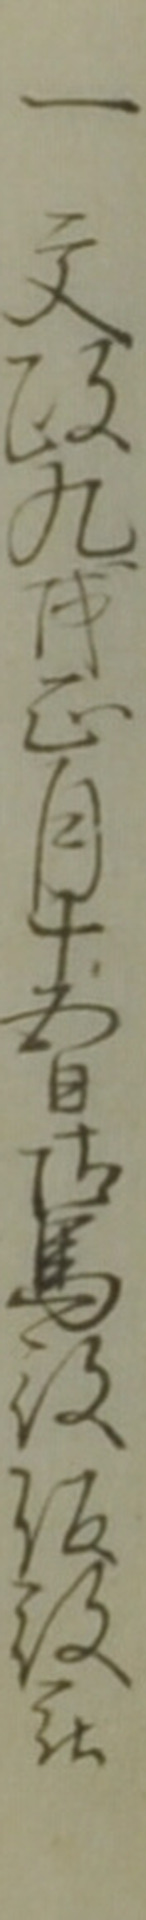一文政九戌正月十五日御馬役仮役被
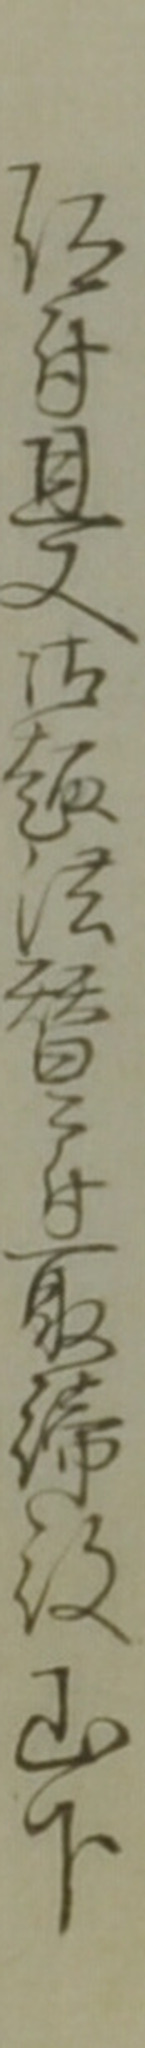仰付且又御趣法替ニ付取締役山下
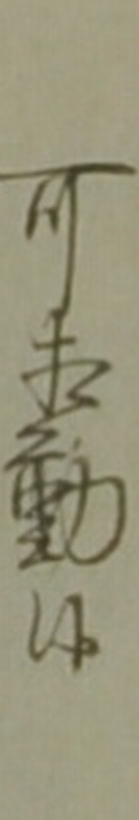可相勤候
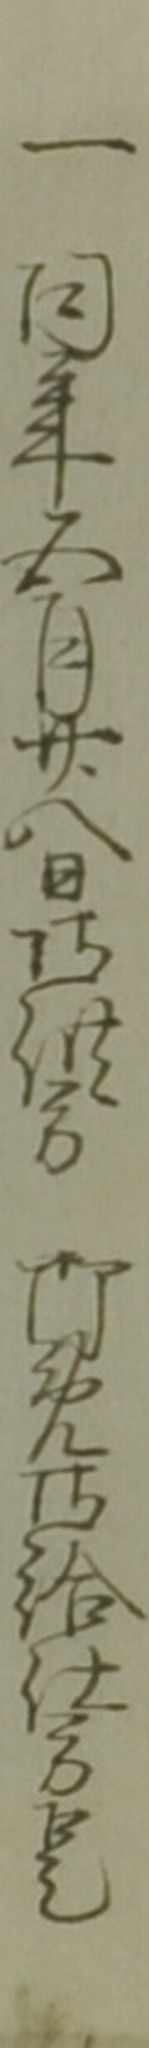一同年五月廿八日御供方御免御給仕方是
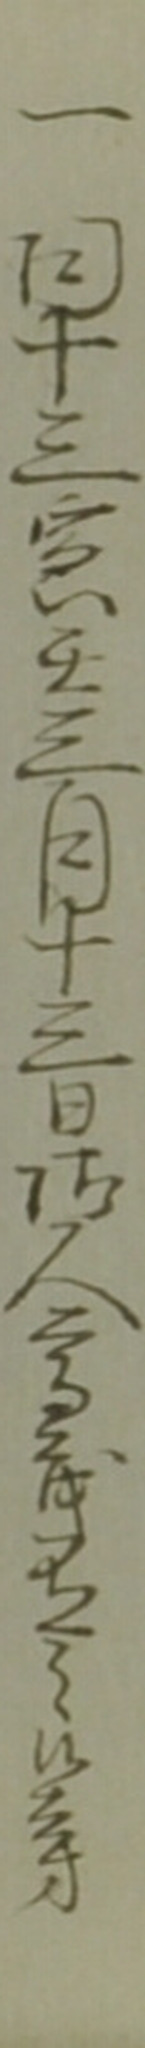一同十三寅閏三月十三日御人高茂有之候旁
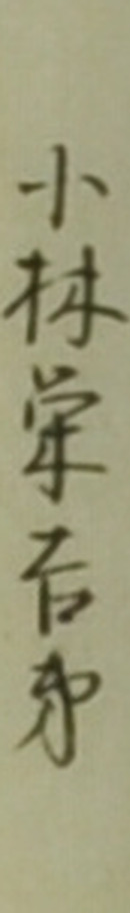小林栄吉弟

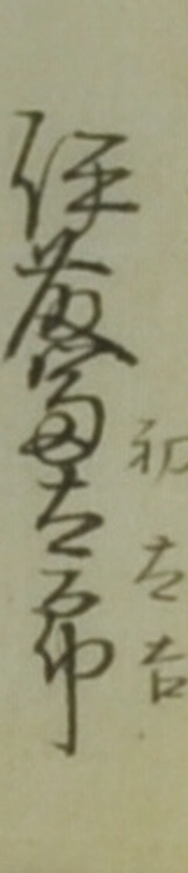伊藤冨太郎
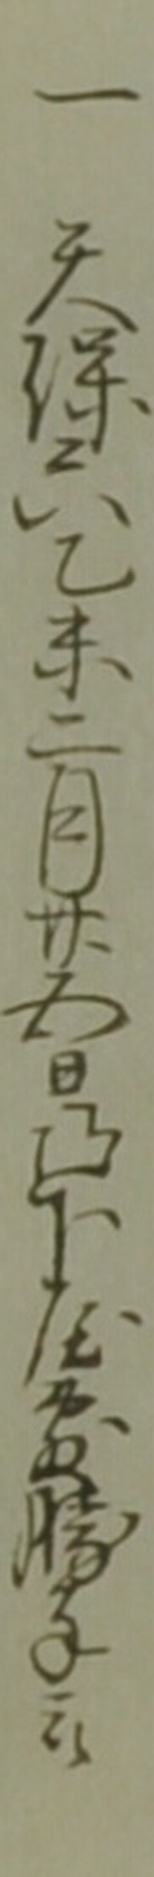一天保六乙未二月廿五日御下屋敷勝手被
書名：無足諸士勤仕録（一）
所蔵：伊那市立高遠町図書館・合同会社AMANE
